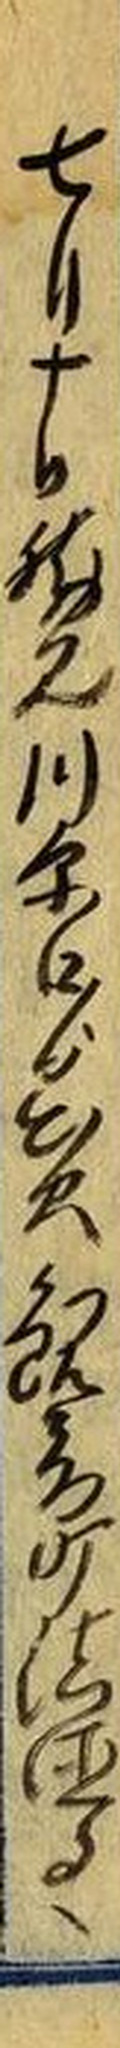七月十日勝見川原口ゟ出火観音町法徳寺へ
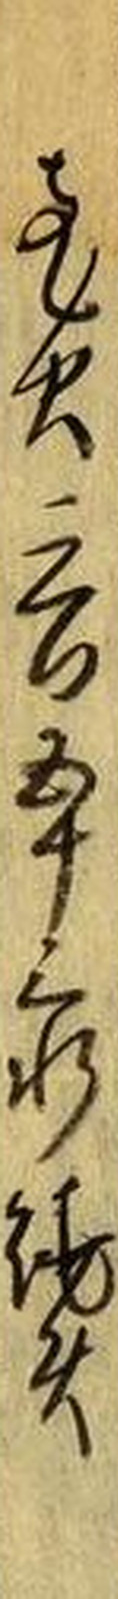飛火三百五十三軒焼失
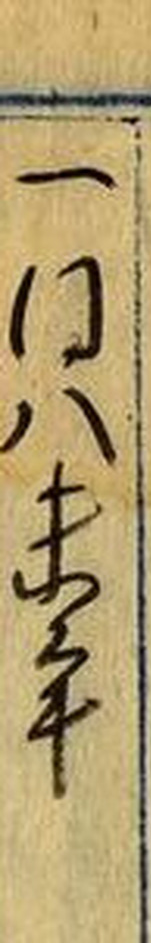一同八未年
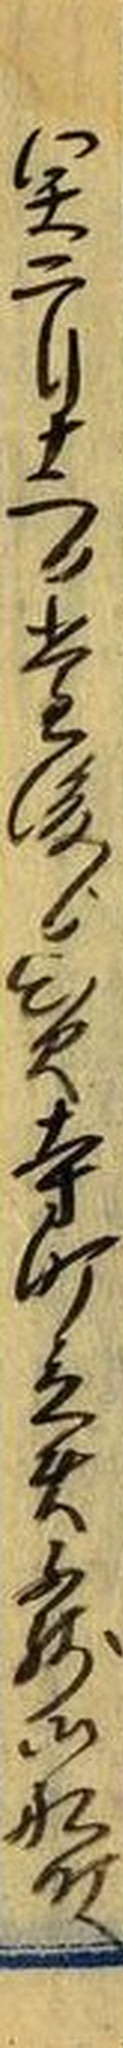閏二月十二日堂後ゟ出火寺町立矢不残御船町へ
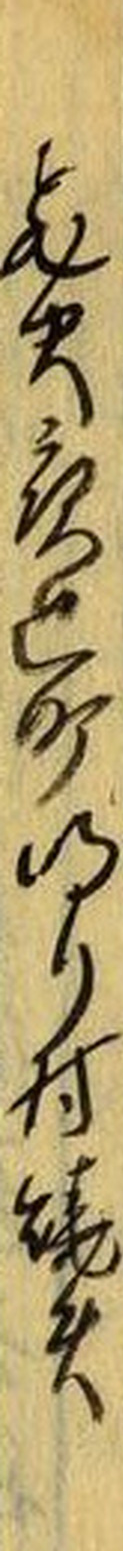飛火夜廻町明り村焼失
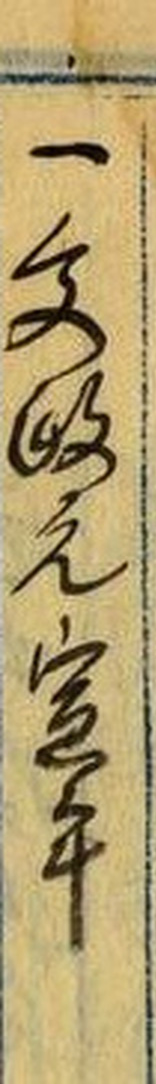一文政元年寅年
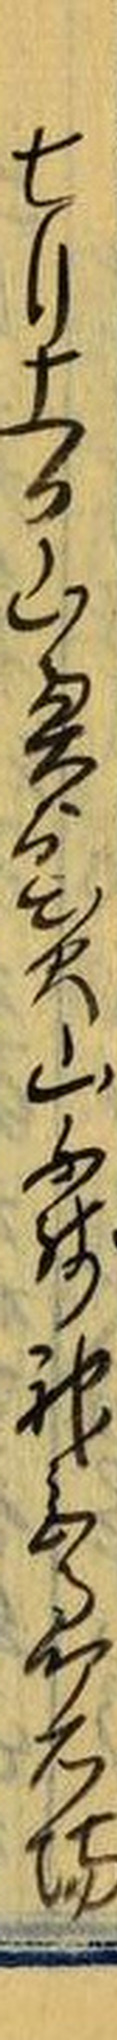七月十一日山奥ゟ出火山不残神宮町石場
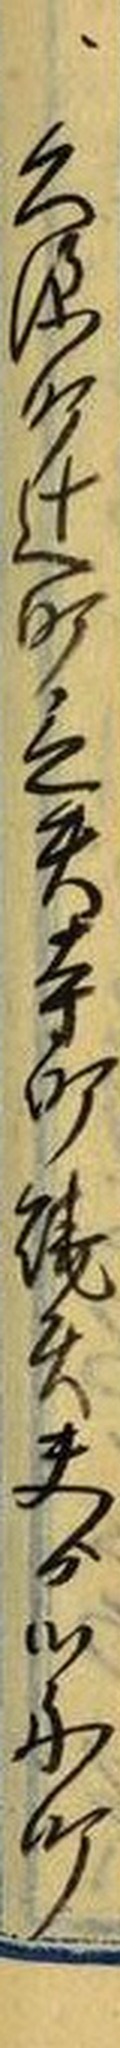久儀町辻町立矢寺町焼失夫ゟ御舟町
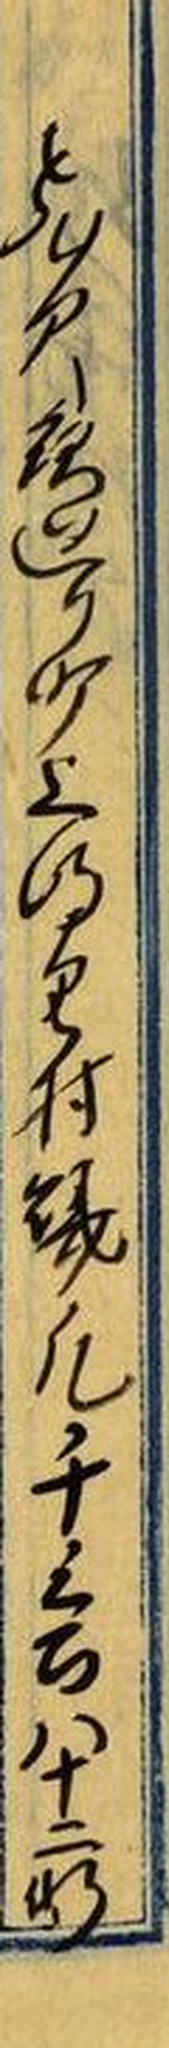飛火銘廻り町上明里村焼凡千三百八十二軒
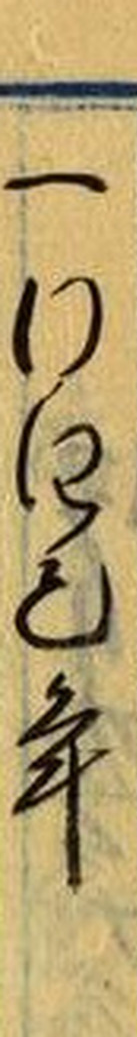一同四巳年
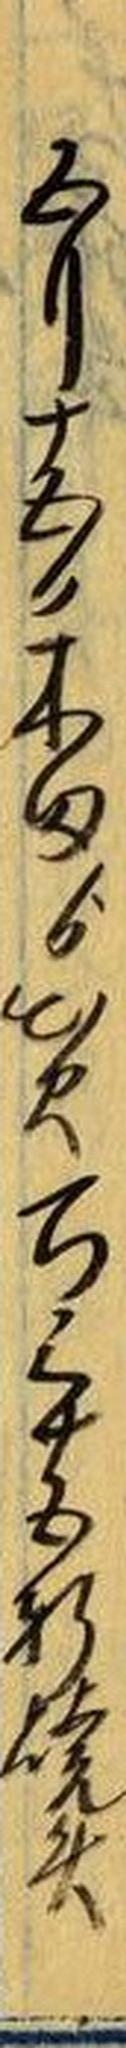五月十五日木田ゟ出火百三十五軒焼失
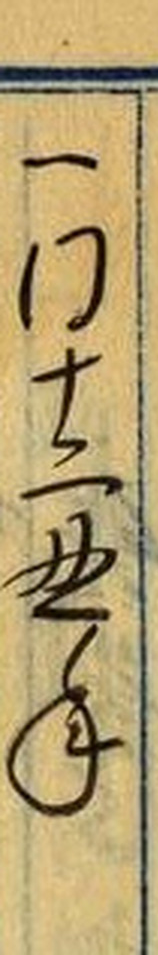一同十二丑年
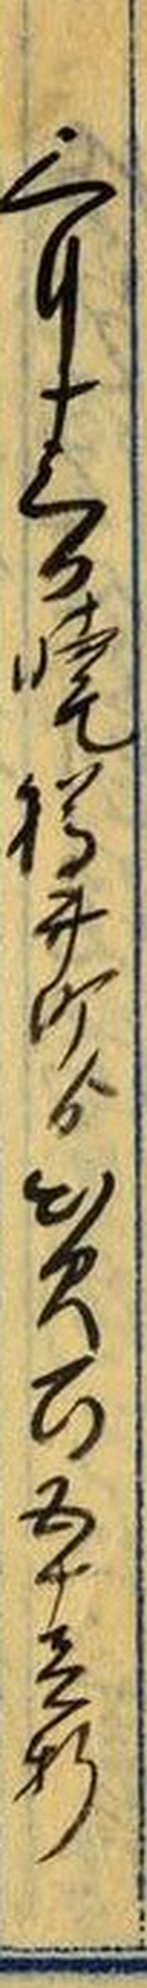三月十三日暁樽井町ゟ出火百五十壱軒
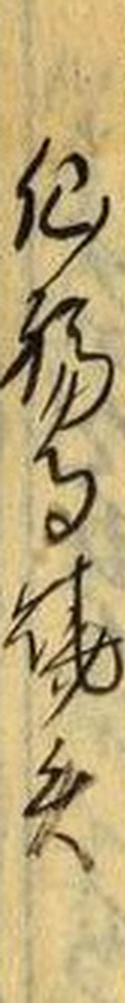仏福寺焼失
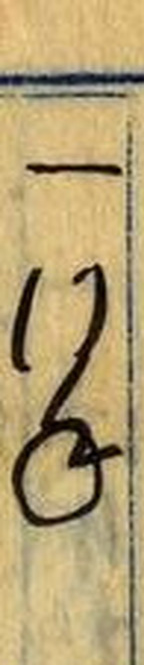一同年
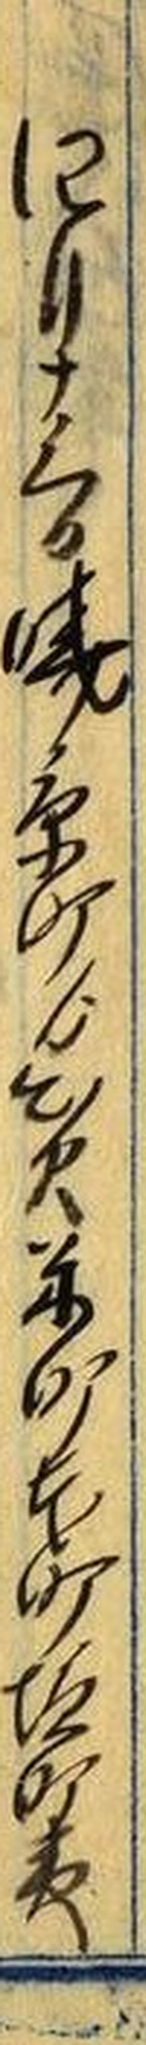四月十三日暁京町ゟ出火米町本町塩町夷
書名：温古集 五巻
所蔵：福井県文書館 Fukui Prefectural Archives
